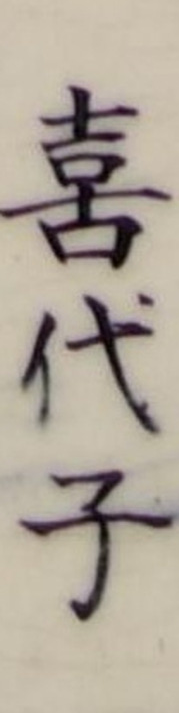喜代子
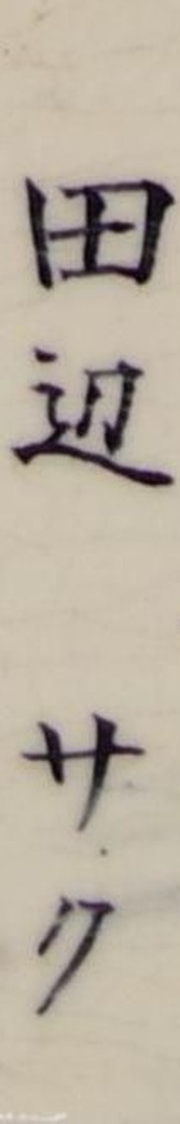田辺サク
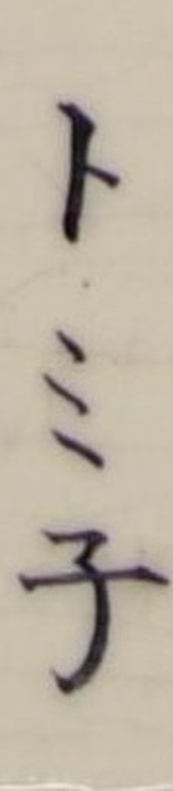トミ子
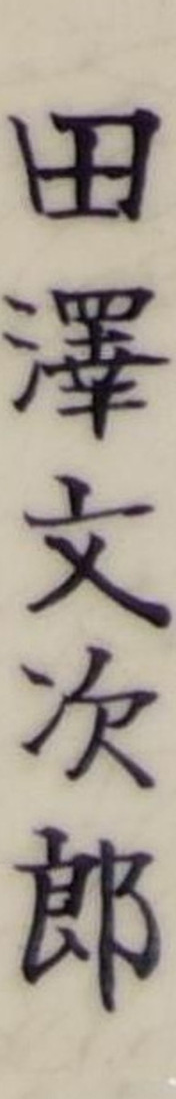田澤文次郎
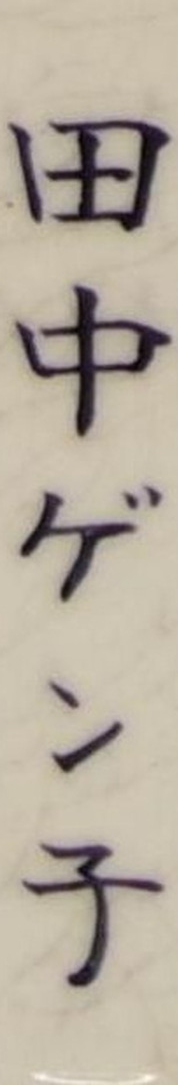田中ゲン子
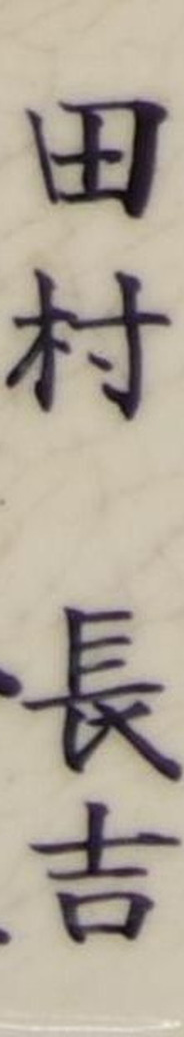田村長吉
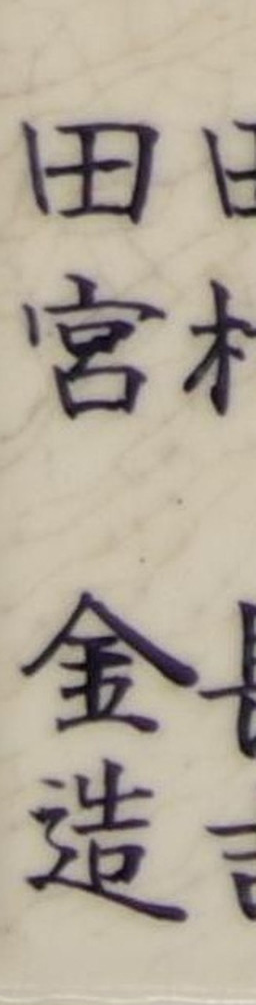田宮金造

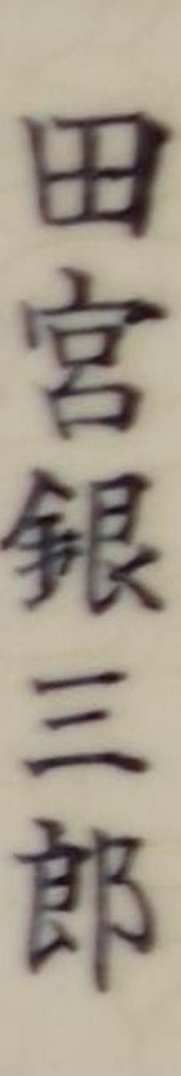田宮銀三郎
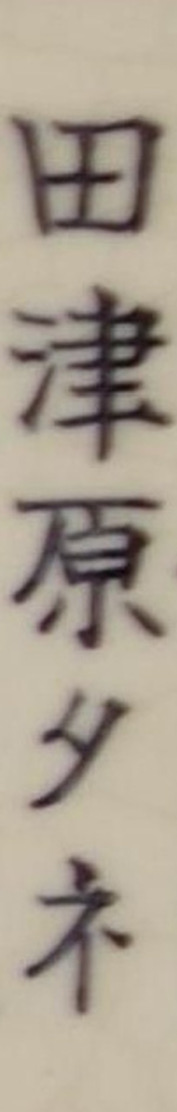田津原タネ
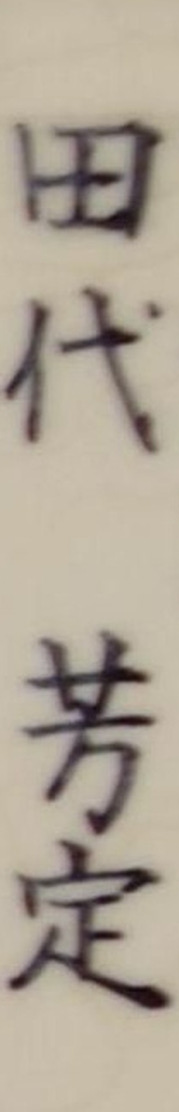田代芳定
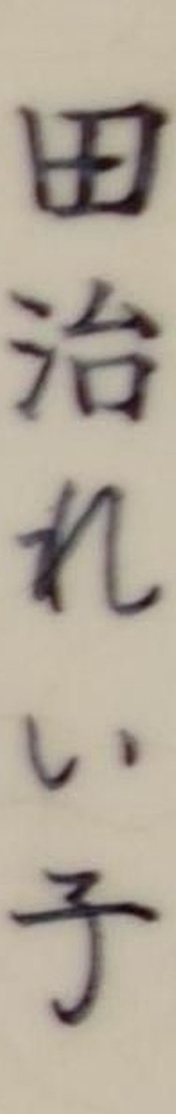田治れい子
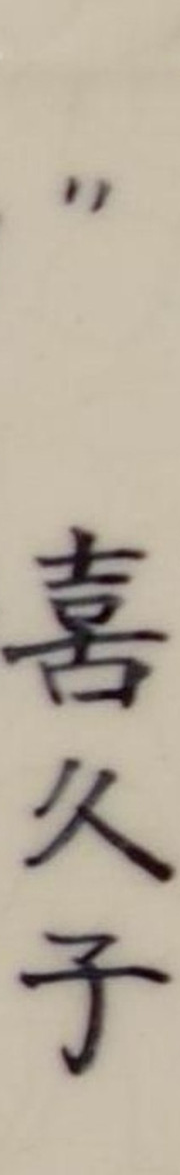喜久子
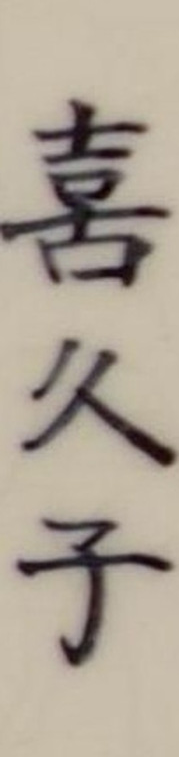喜久子
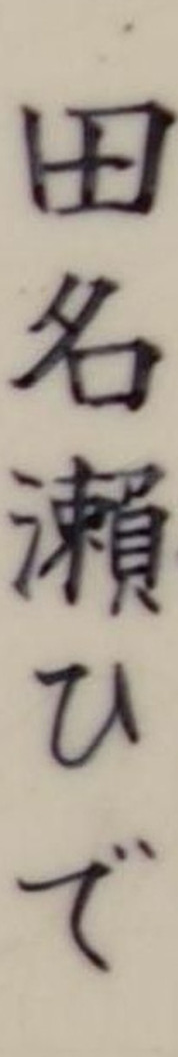田名瀬ひで
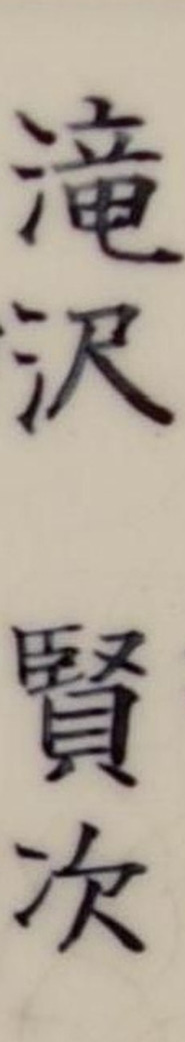滝沢賢次
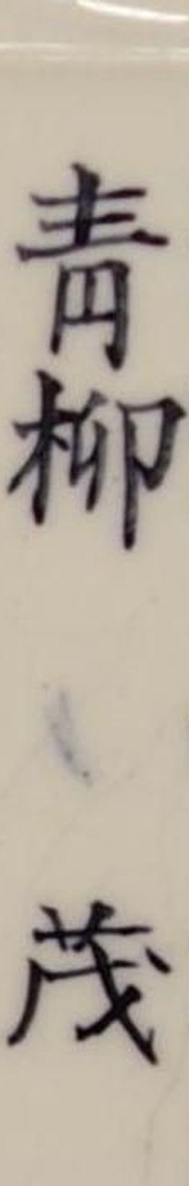青柳茂
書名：E~L
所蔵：高野山金剛峯寺
